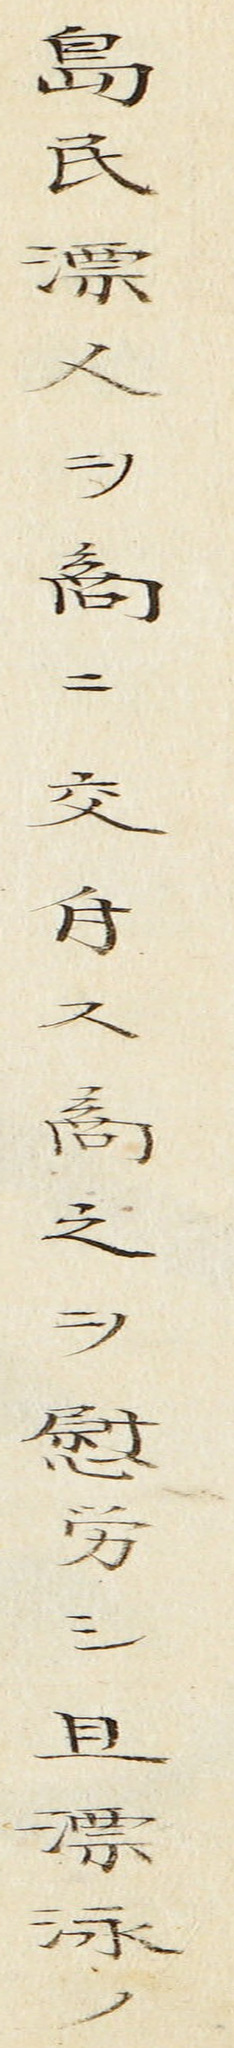島民漂人ヲ商ニ交付ス商之ヲ慰労シ且漂泳ノ
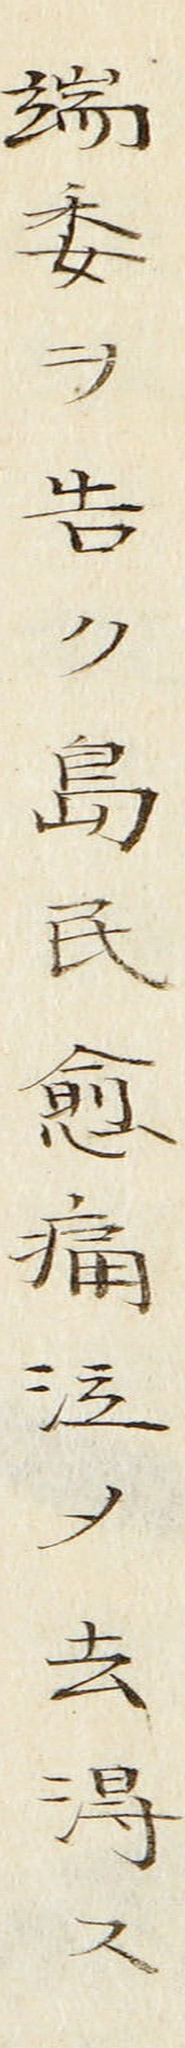端委ヲ告ク島民愈痛泣シテ去得ス
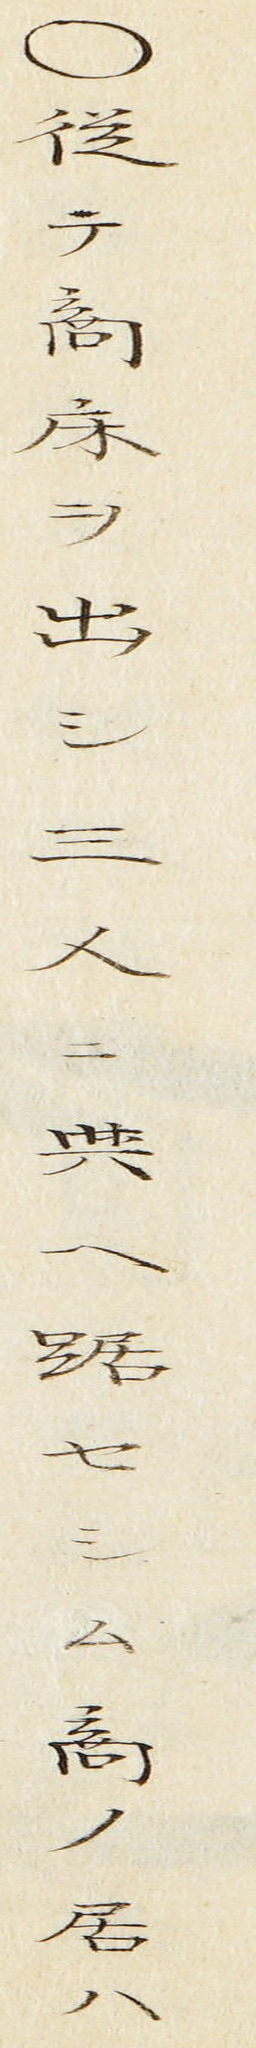○従テ商床ヲ出シ三人ニ与ヘ踞セシム商ノ居ハ
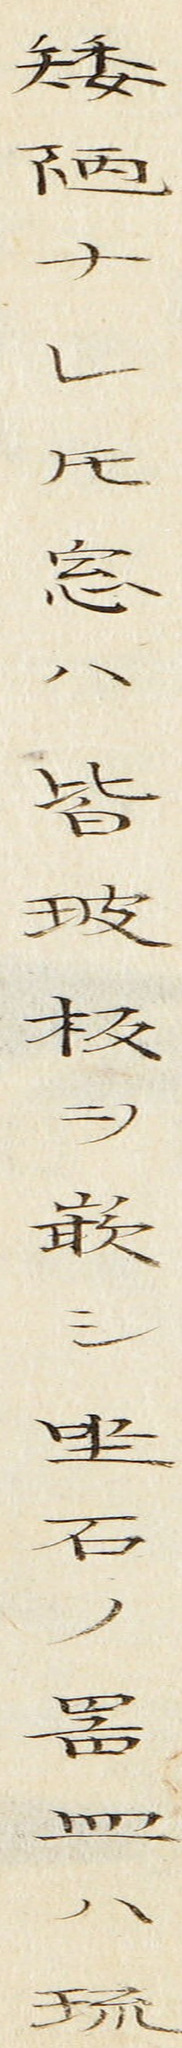矮陋ナレトモ窓ハ皆玻板ヲ嵌シ坐石ノ器皿ハ琉
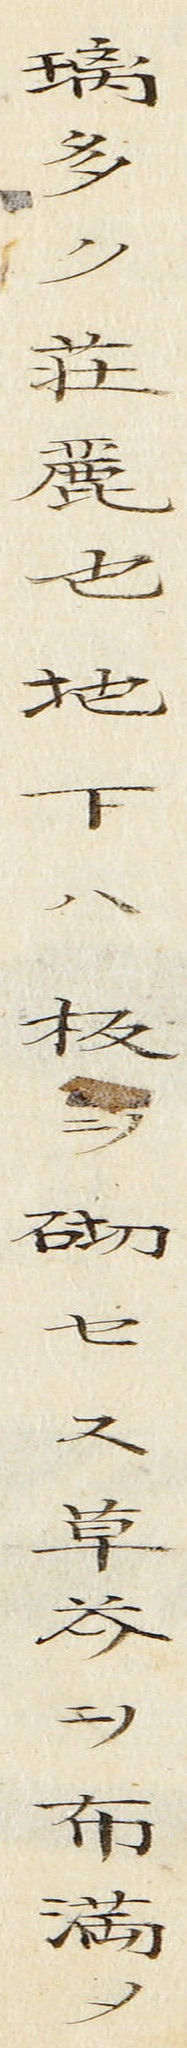璃多ク荘麗也地下ハ板ヲ砌セス草芥ヲ布満シテ
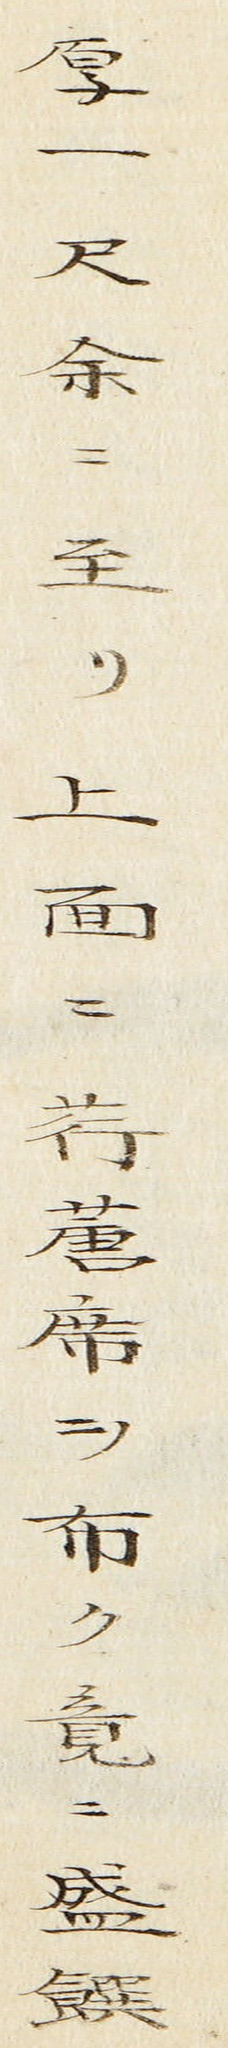厚一尺余ニ至リ上面ニ荇蓎席ヲ布ク竟ニ盛饌
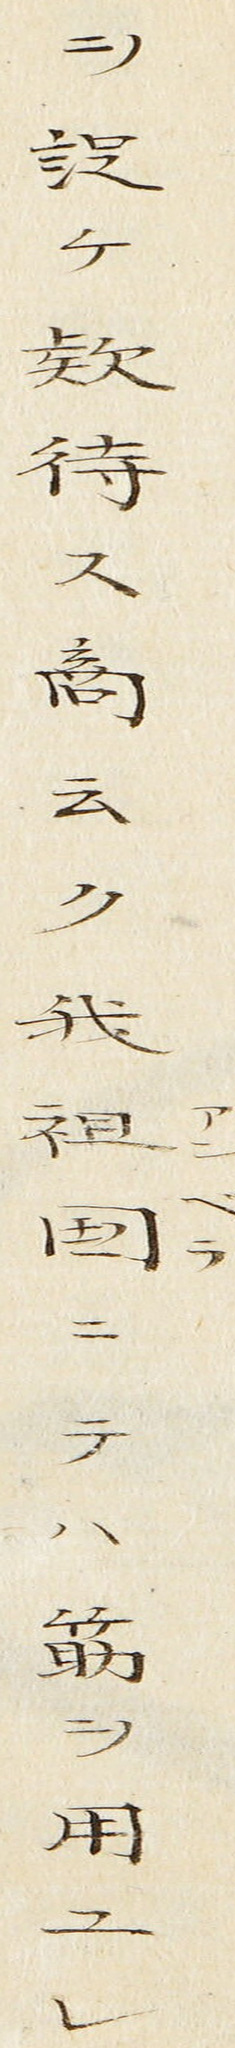ヲ設ケ欵待ス商云ク我祖国ニテハ筯ヲ用ユレ
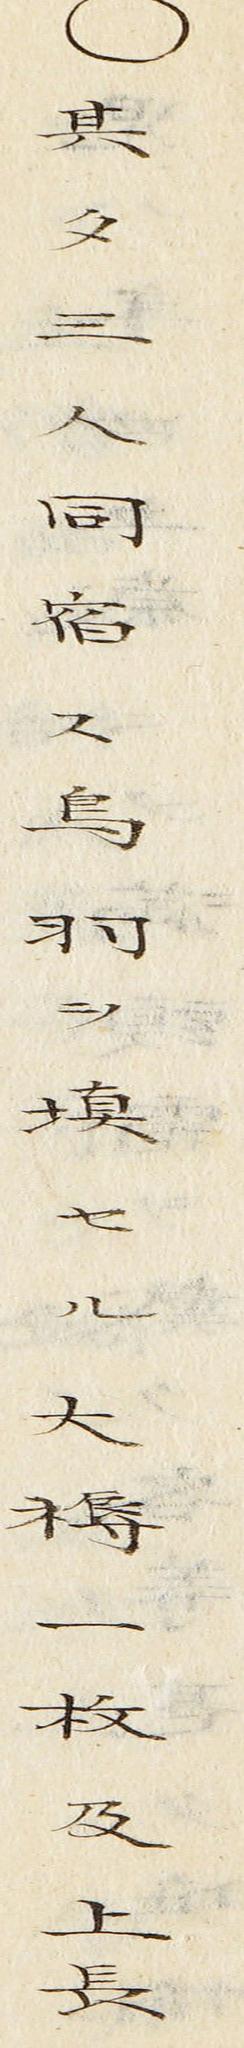○其夕三人同宿ス鳥羽ヲ填セル大褥一枚及上長
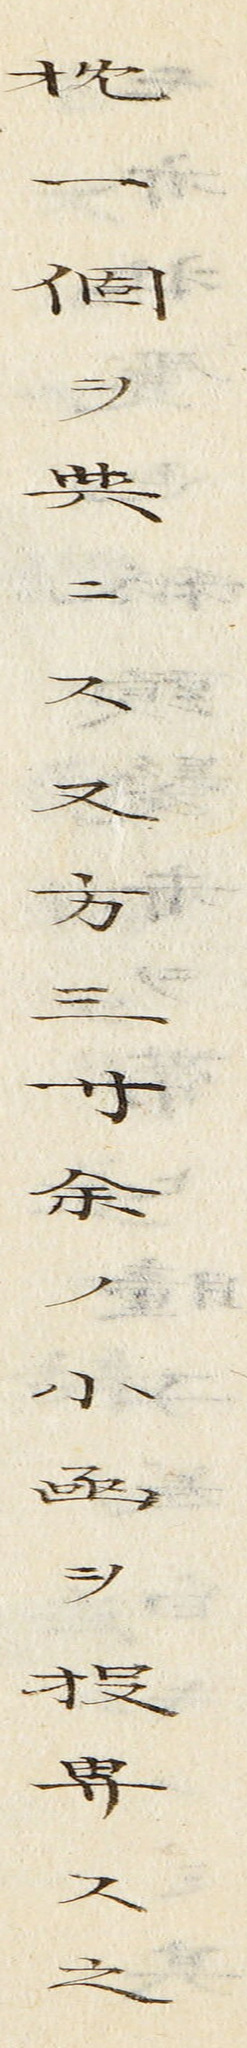枕一個ヲ与ニス又方三寸余ノ小函ヲ投畀ス之
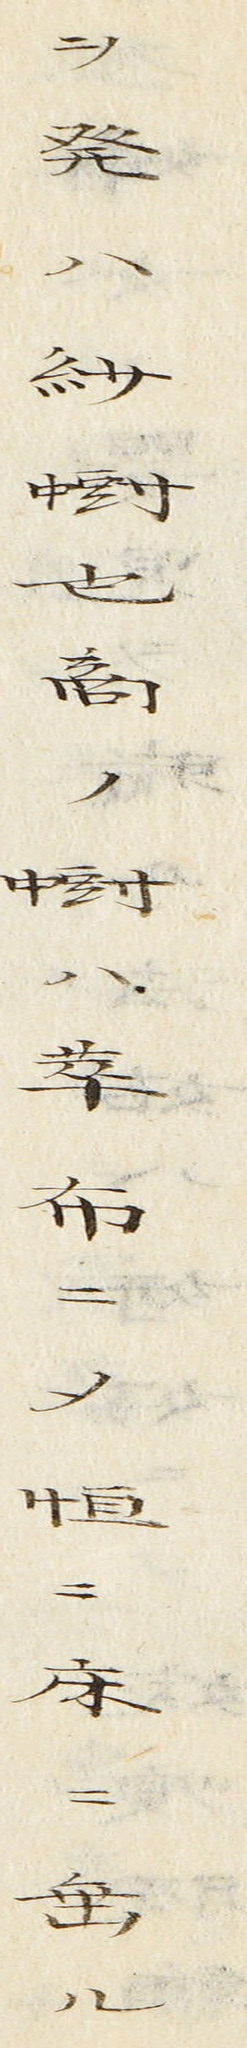ヲ発ハ紗幮也商ノ幮ハ萃布ニシテ恒ニ床ニ垂ル
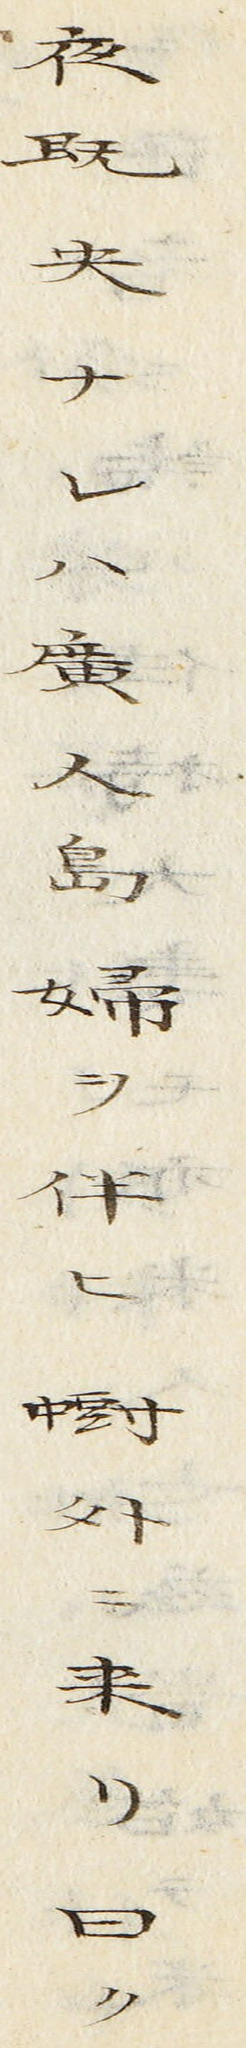夜既央ナレハ広人島婦ヲ伴ヒ幮外ニ来リ曰ク
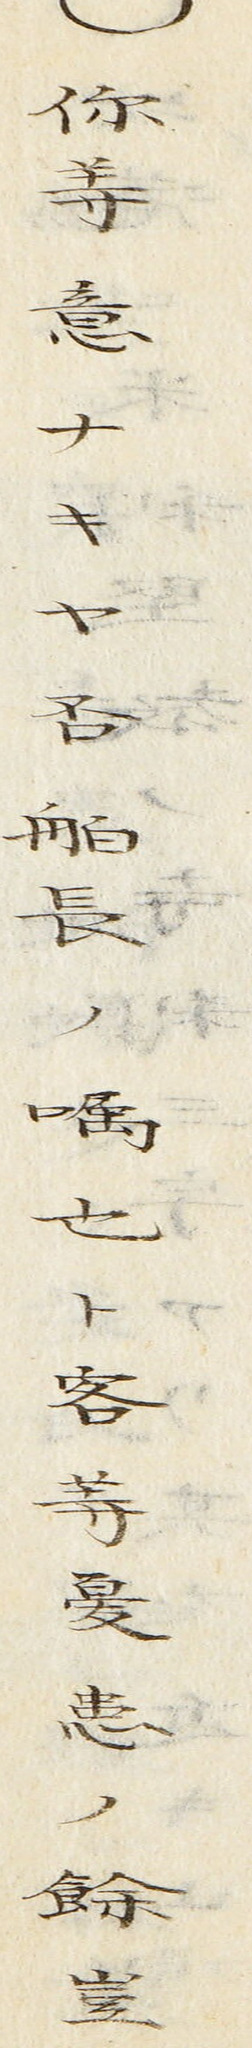○你等意ナキヤ否舶長ノ嘱也ト客等憂患ノ余豈
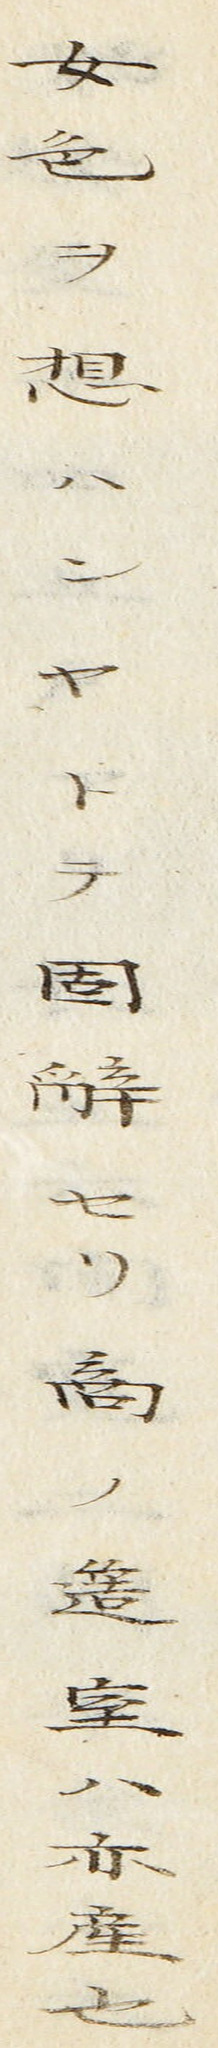女色ヲ想ハンヤトテ固辞セリ商ノ簉室ハ亦産也
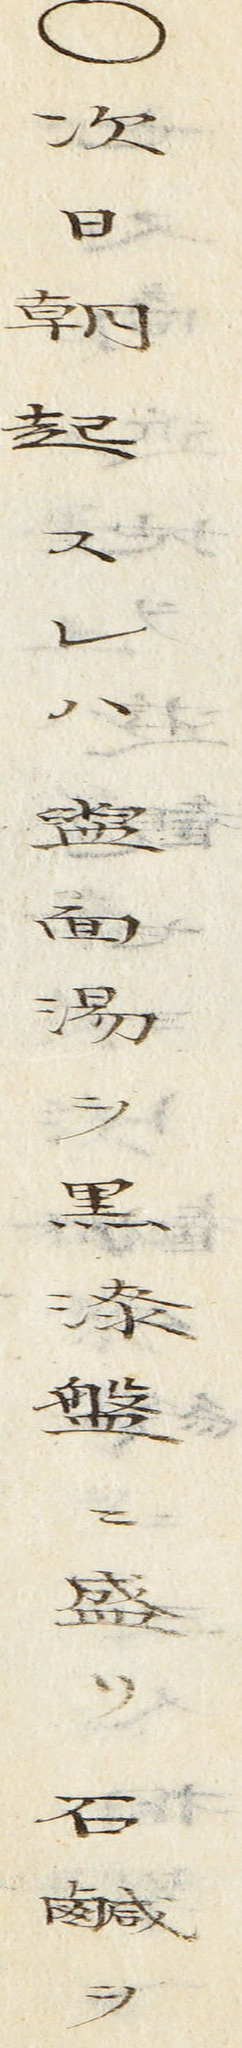○次日朝起スレハ盥面湯ヲ黒漆盤ニ盛リ石鹹ヲ
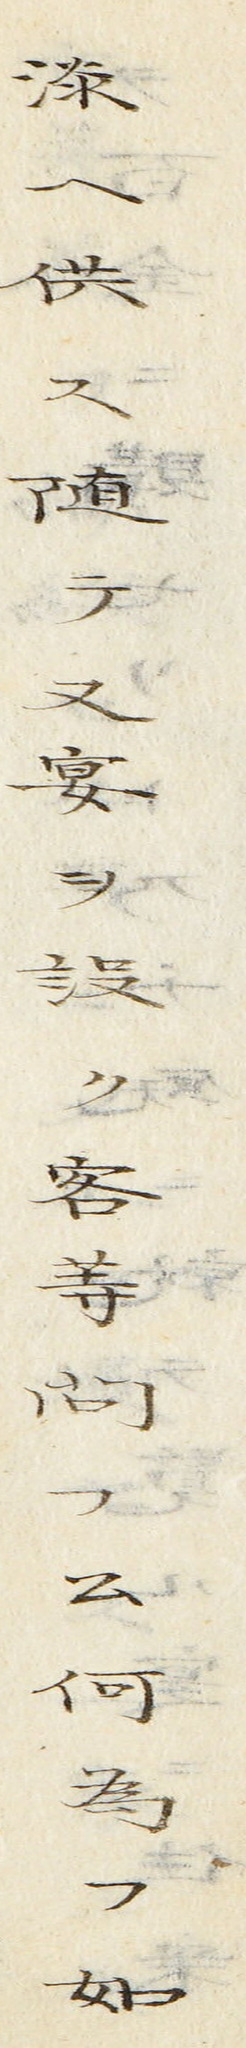添ヘ供ス随テ又宴ヲ設ク客等問フ公何為フ如
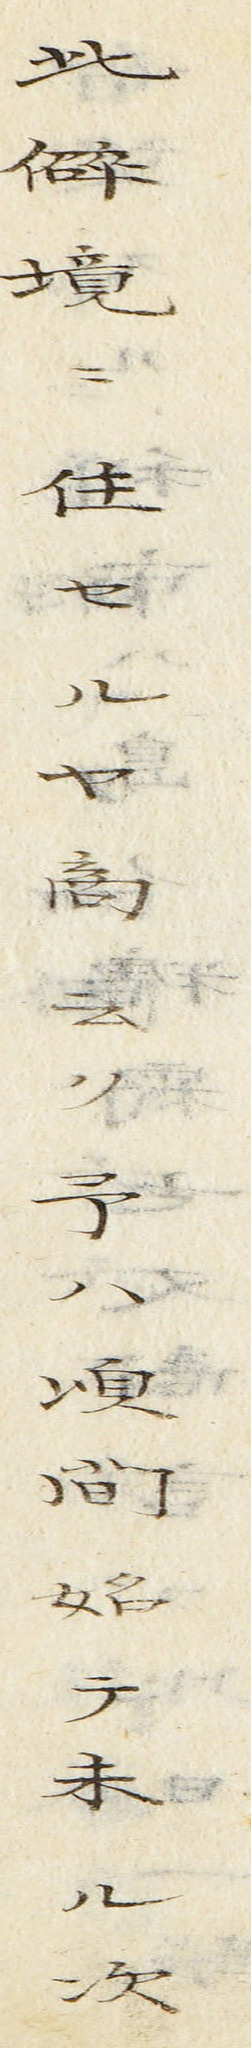此僻境ニ住セルヤ商云ク予ハ頃間始テ未＃ル次
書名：蕃談
